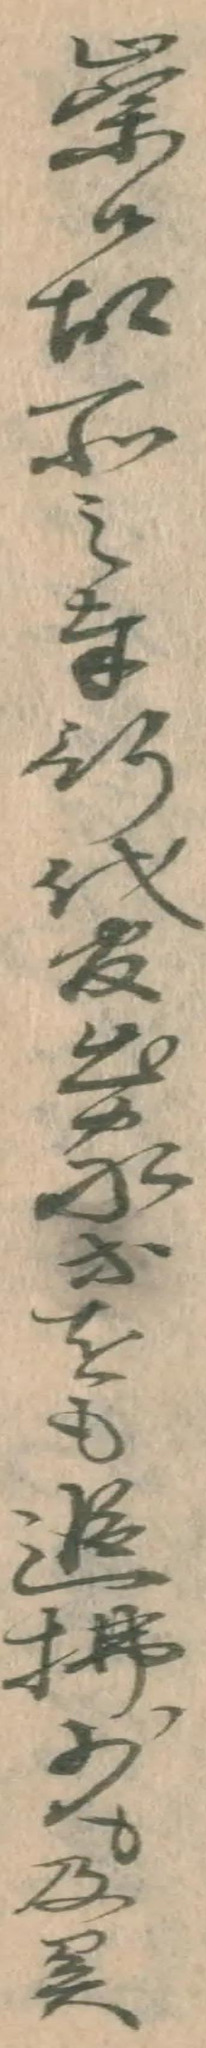崇候故所之奉行代官出家方をも追払少も及異
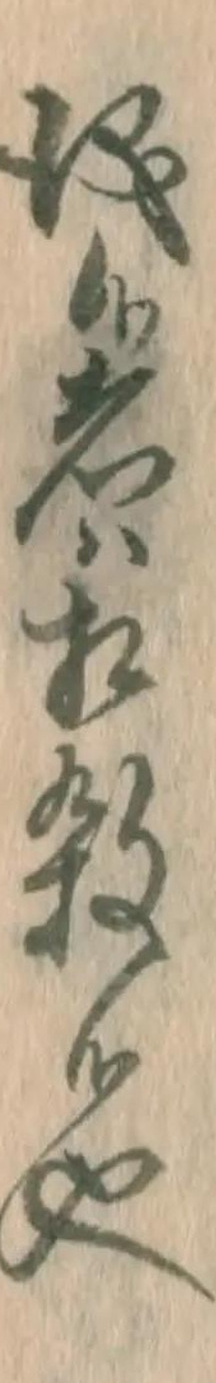儀候者は殺候也
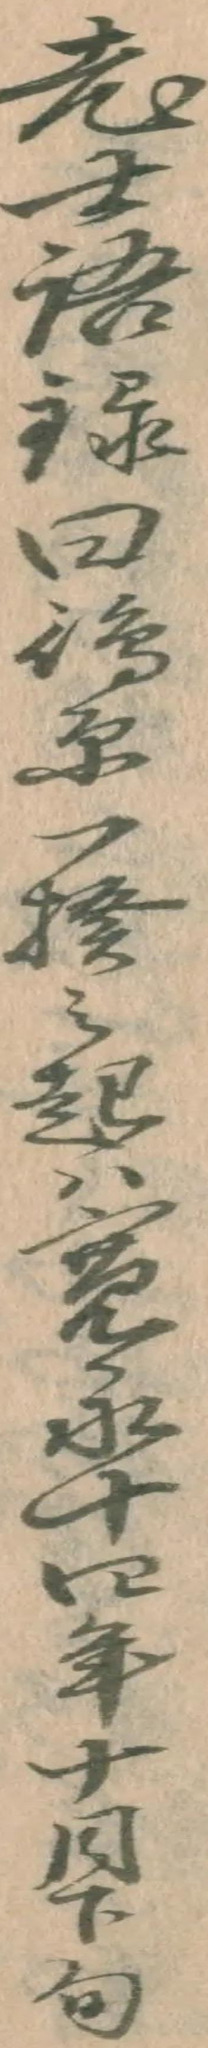老士語録日島原一揆之起は寛永十四年十月下旬
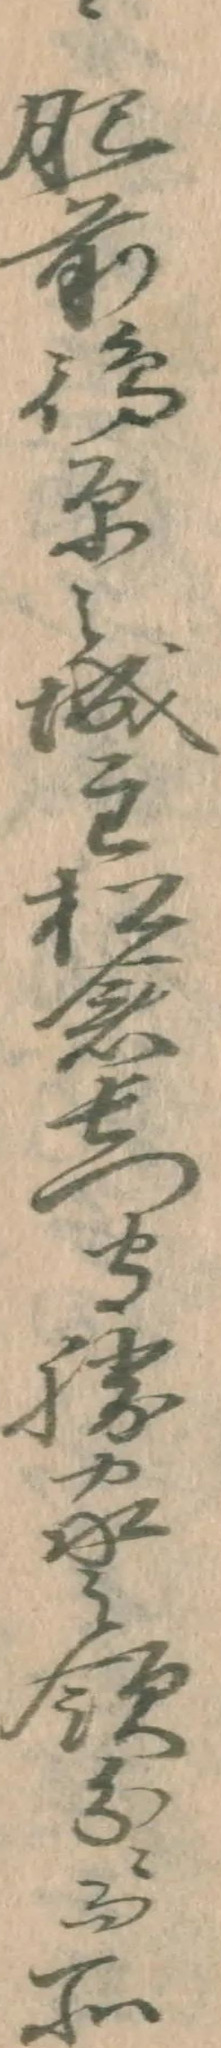に肥前島原之城主松倉長門守勝家之領分に而所
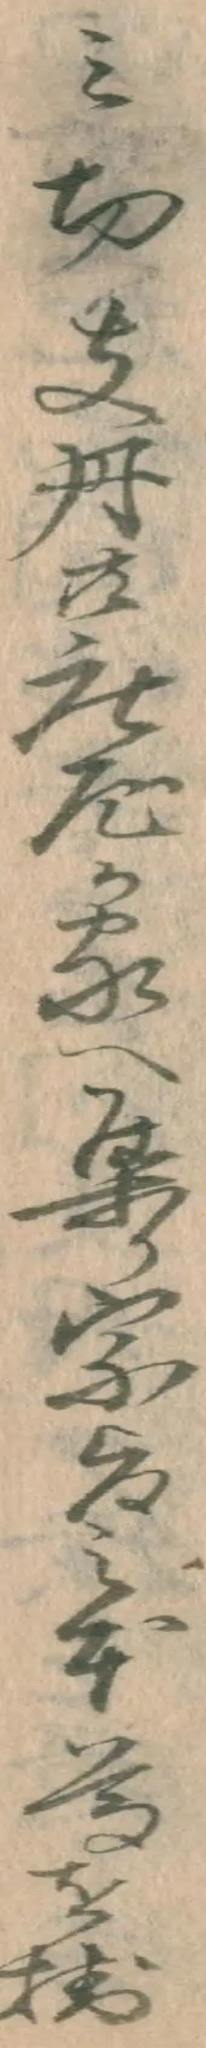之切支丹共庄屋か家へ集り宗旨之本尊を掛
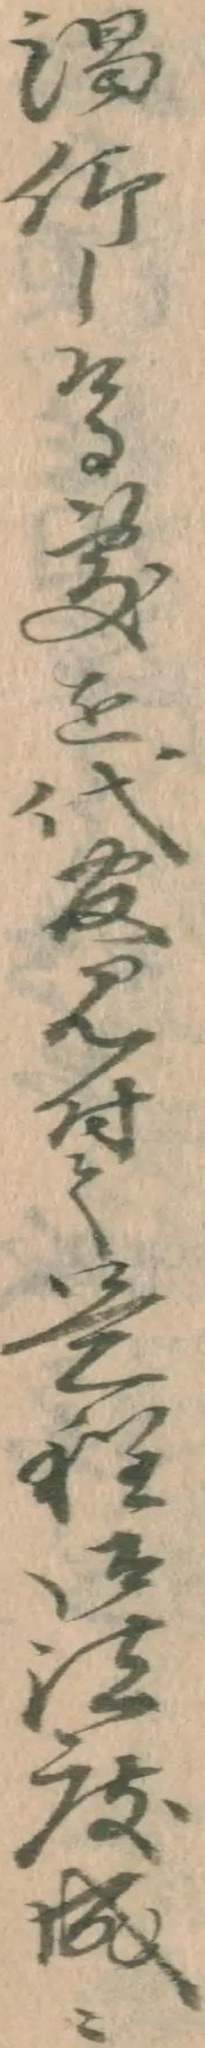渇仰しける処を代官見付て是程御法度成に
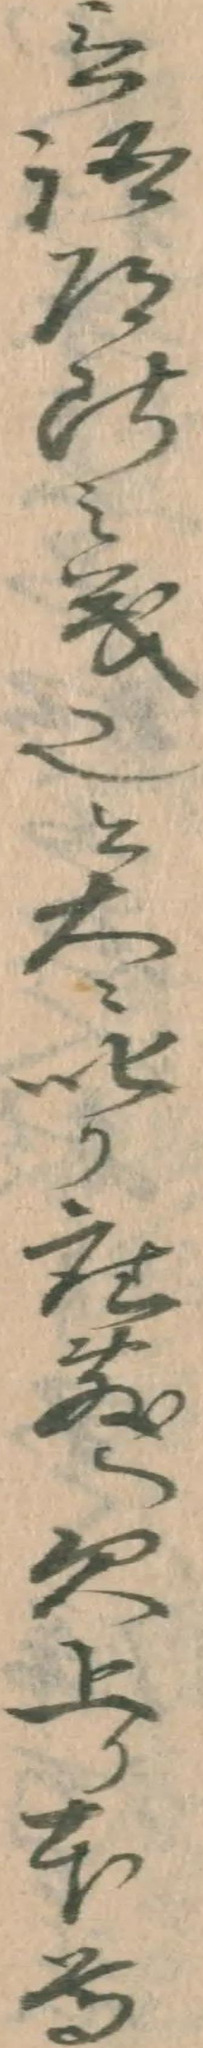言語道断之義也と大に叱り座敷へ欠上り本尊
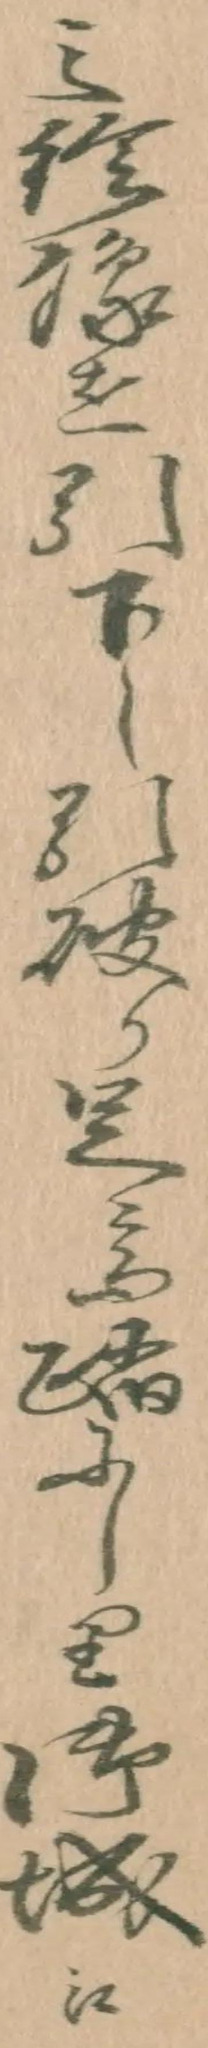之絵像を引下し引破り足に而踏にしり御城え
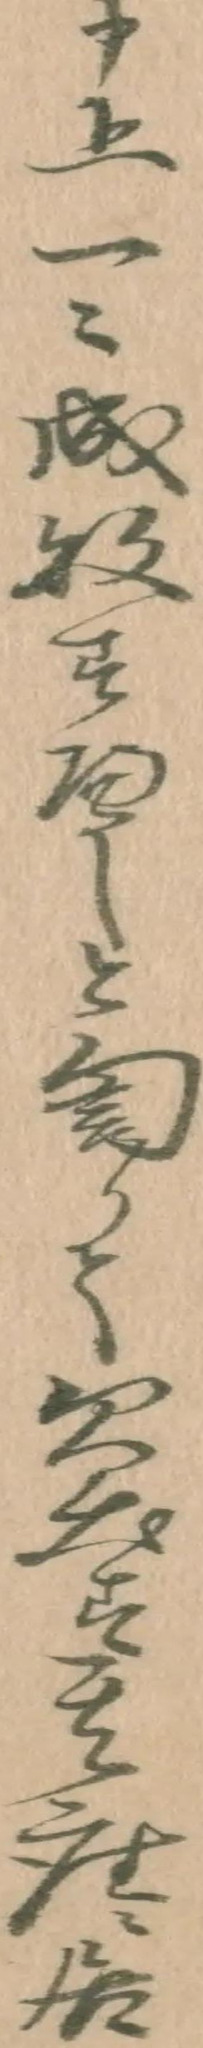申上一々成敗すへしと訇りて欠出す其座に居
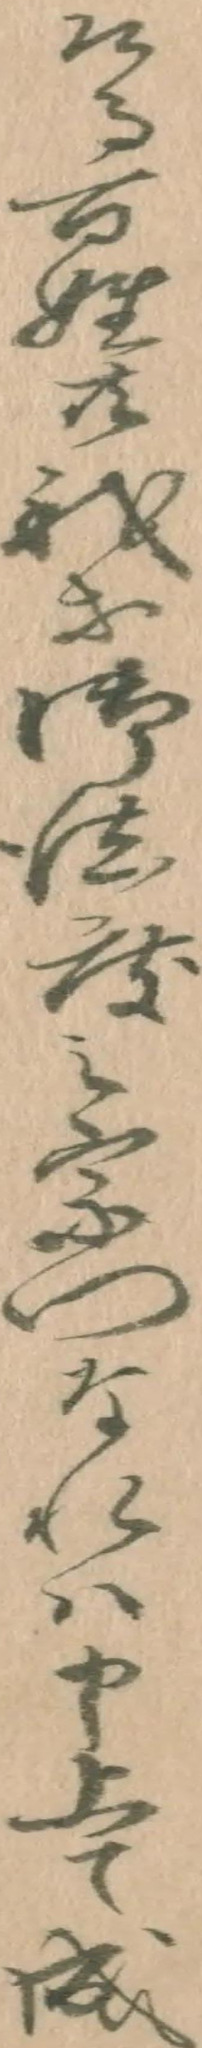ける百姓共我等御法度之宗門なれは申上て成
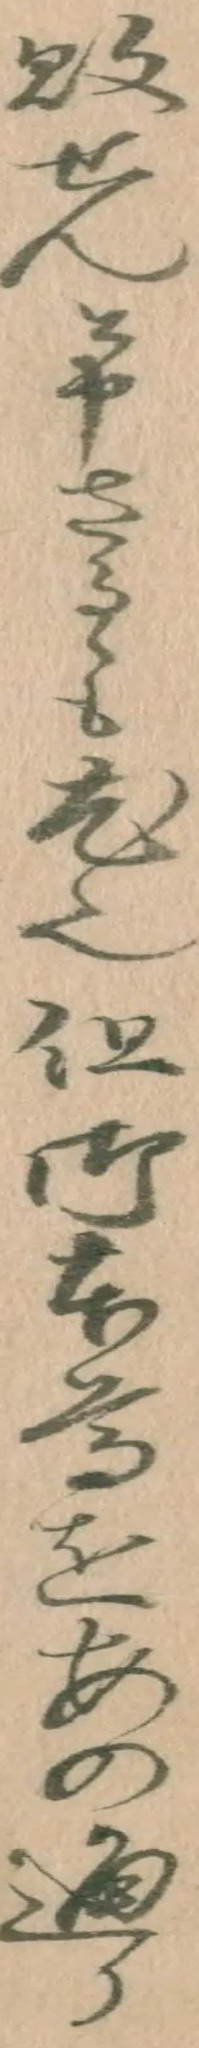敗せんと申さるゝも尤也但御本尊をあの通り
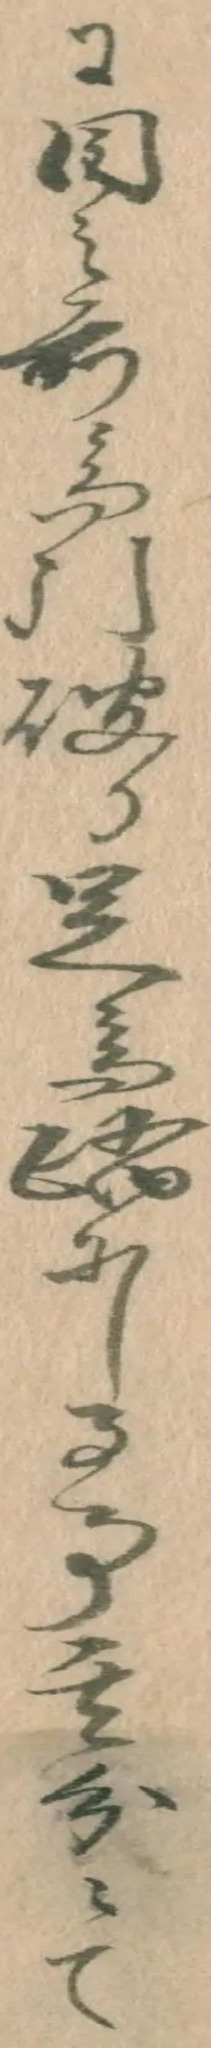に目之前に而引破り足に而踏にしる事其分にて
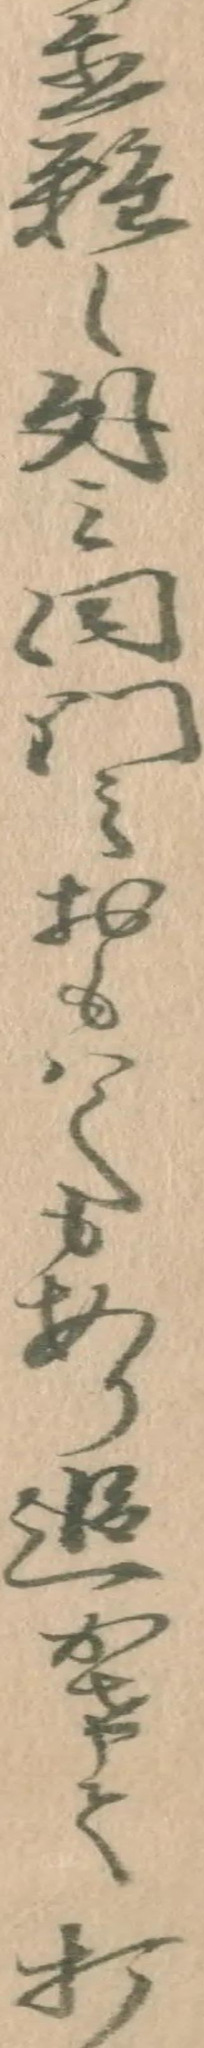置難し外之同門之おもはくもあり追かけて打
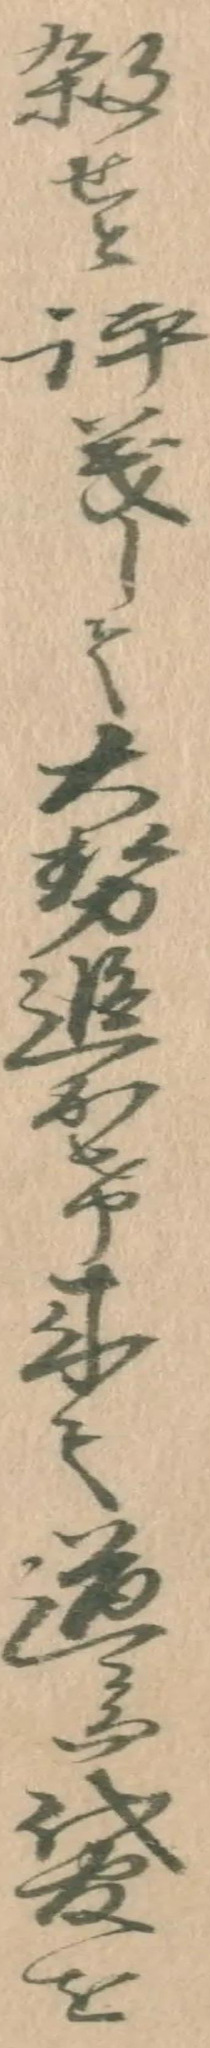殺せと評義して大勢追かけ来て道に而代官を
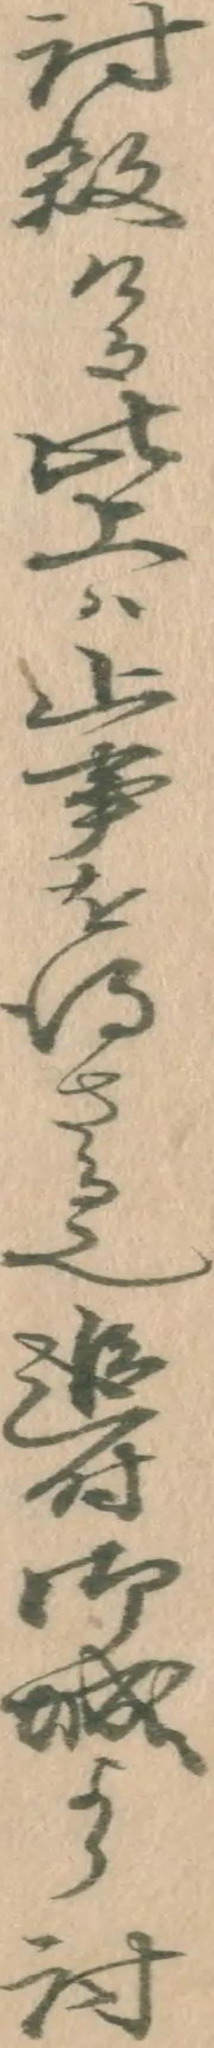討殺ける此上は止事を得さる也追付御城より討
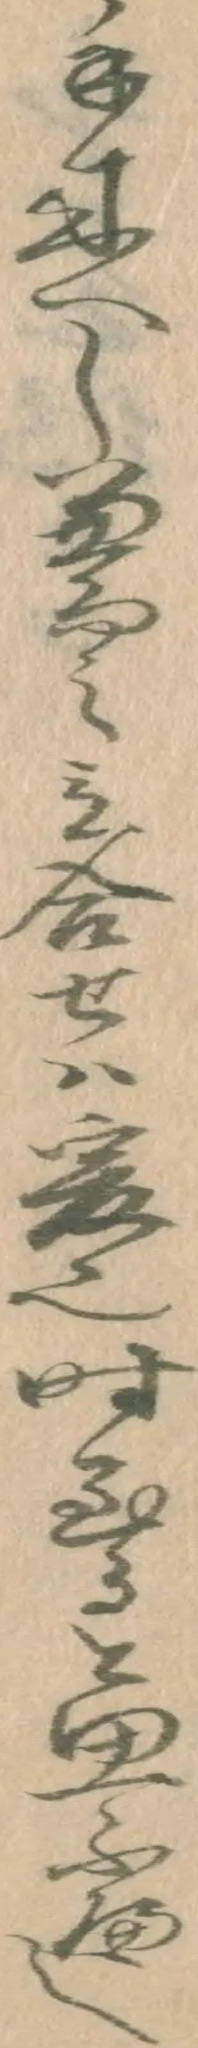手来へし兼而之言合せは爰也時至ると思ふへし
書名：切支丹御退治記 49巻. [1]
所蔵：国立国会図書館 National Diet Library, JAPAN
